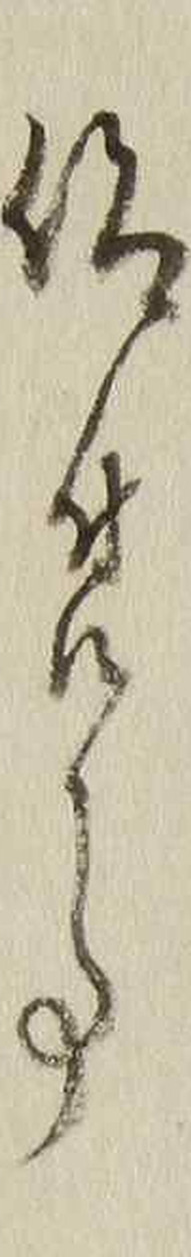仰付候事
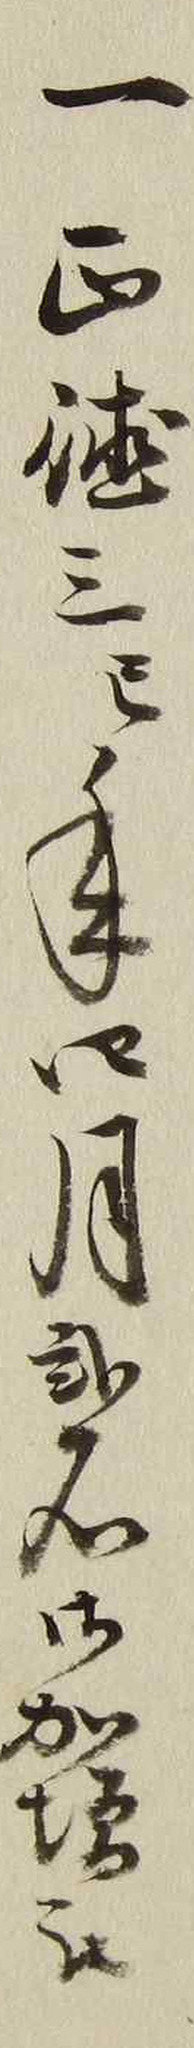一正徳三巳年四月弐石御加増被
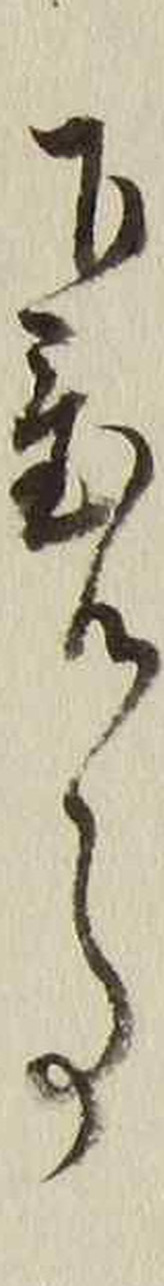下置候事
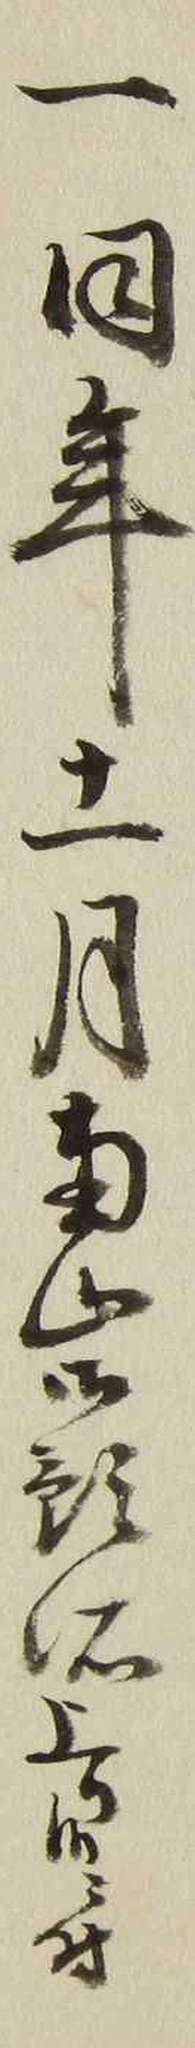一同年十一月南山御預所上り候ニ付
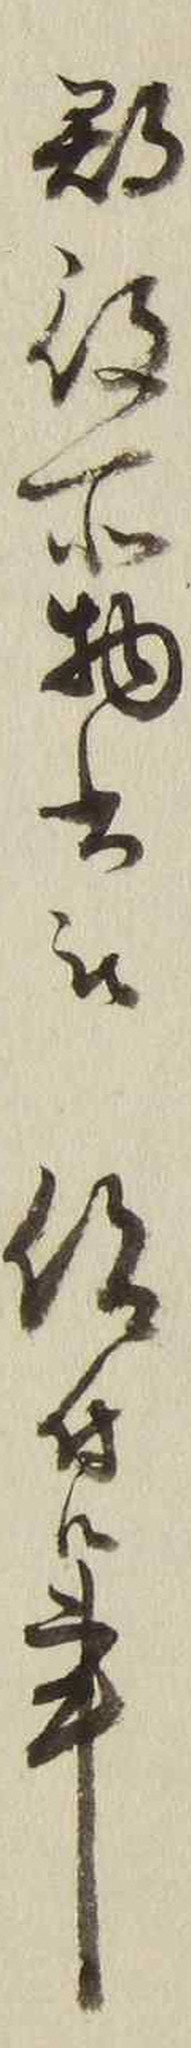郡役所物書被仰付候事
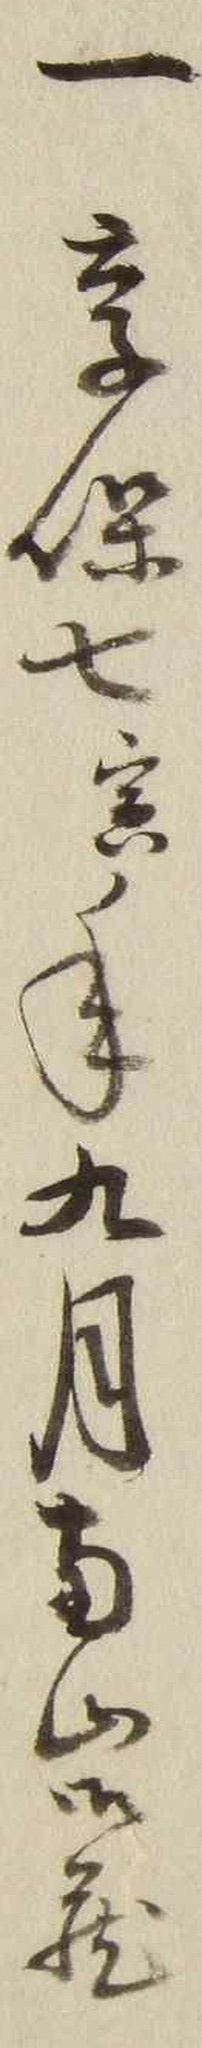一享保七寅年九月南山御蔵

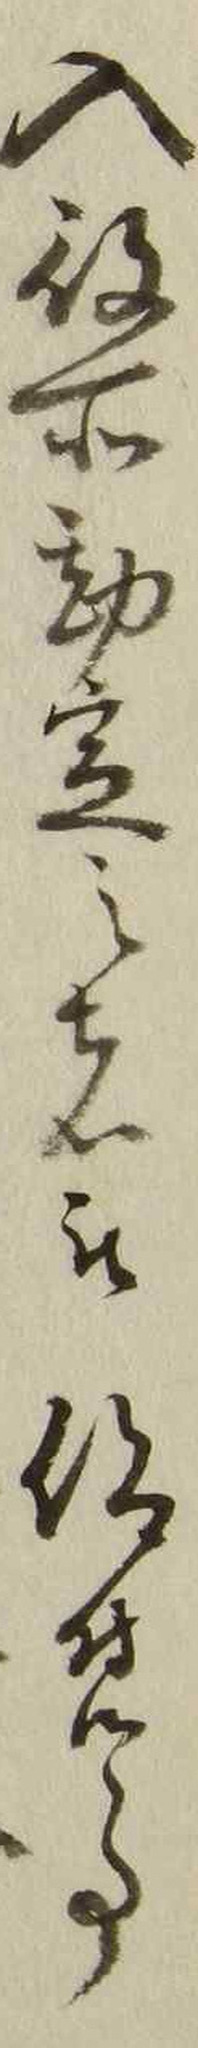入役所勘定之者被仰付候事
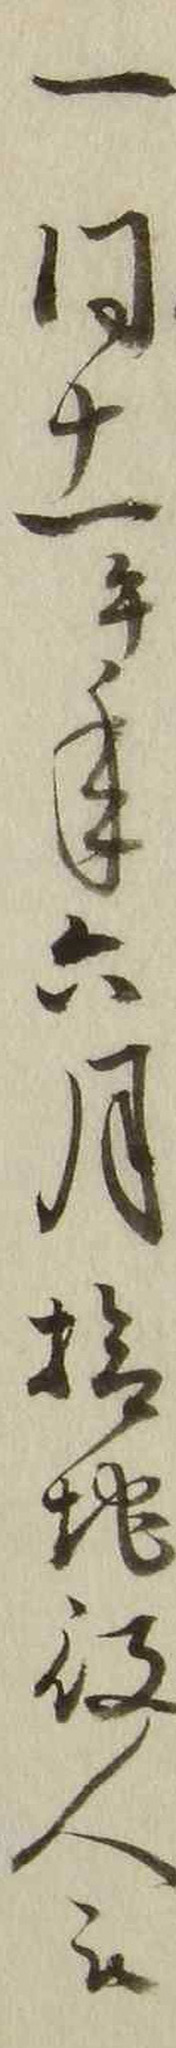一同十一午年六月検地役人被
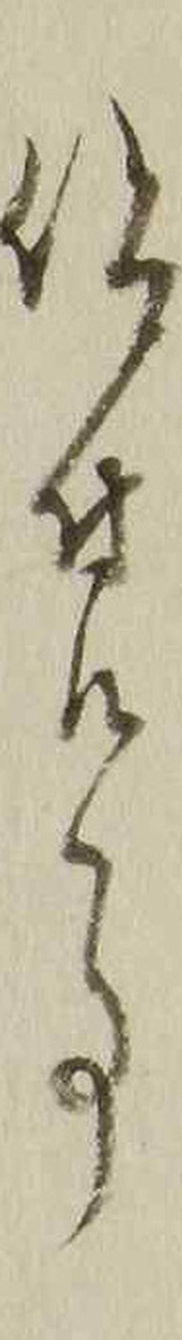仰付候事
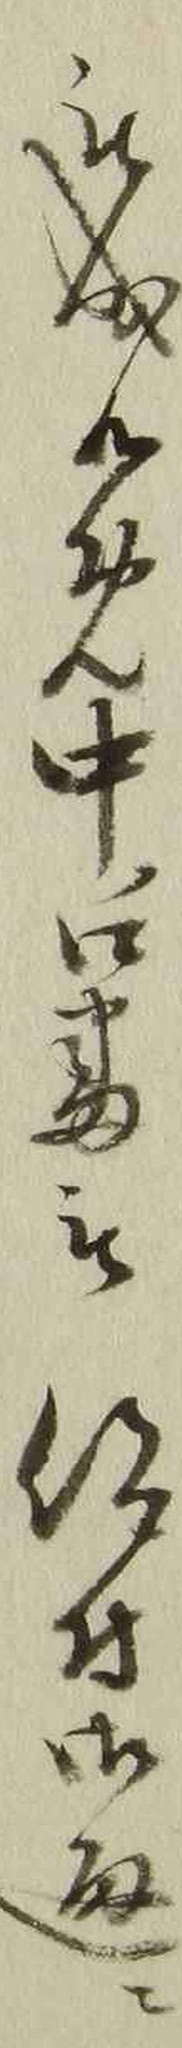被成御免中ノ口番被仰付御通ニ
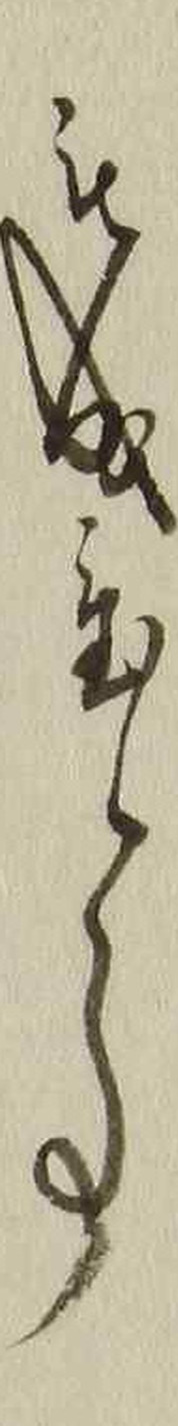被成置候事
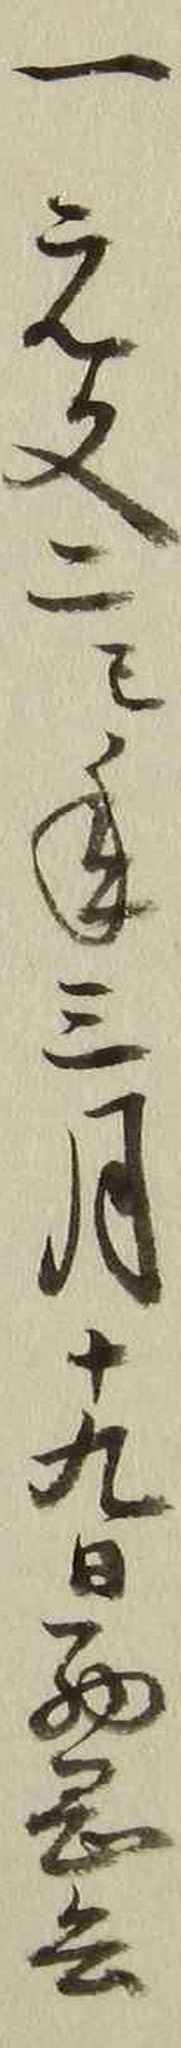一元文二巳年三月十九日西岡兵
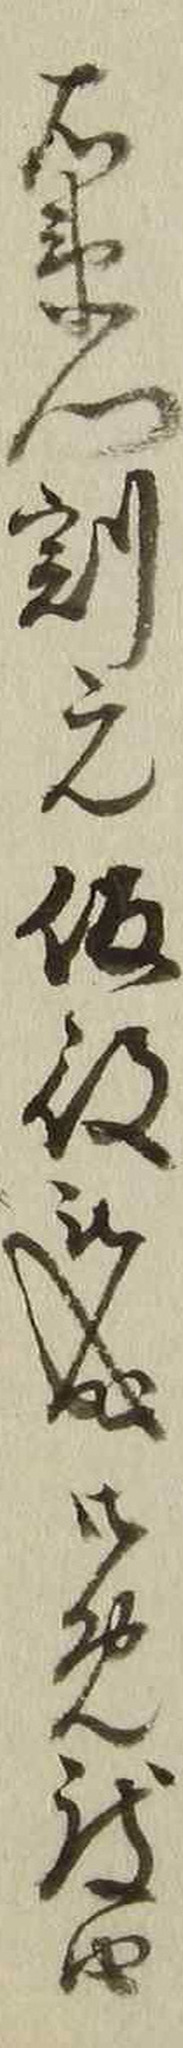右衛門割元仮役被成御免度由
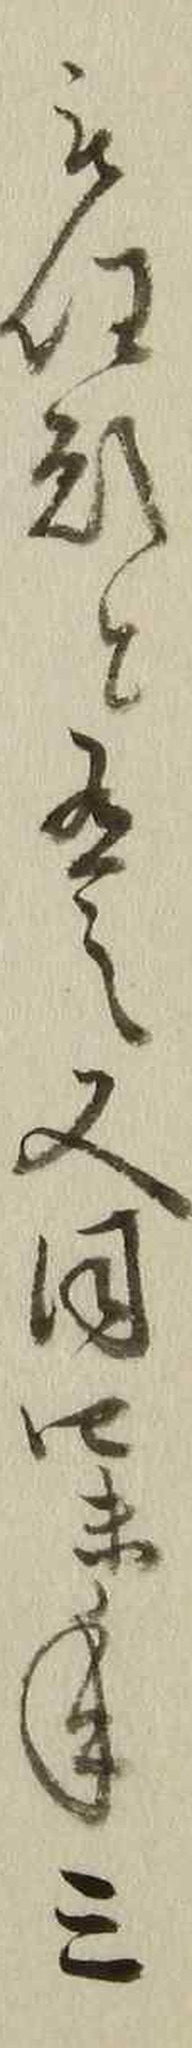被任願と有之又同四未年三
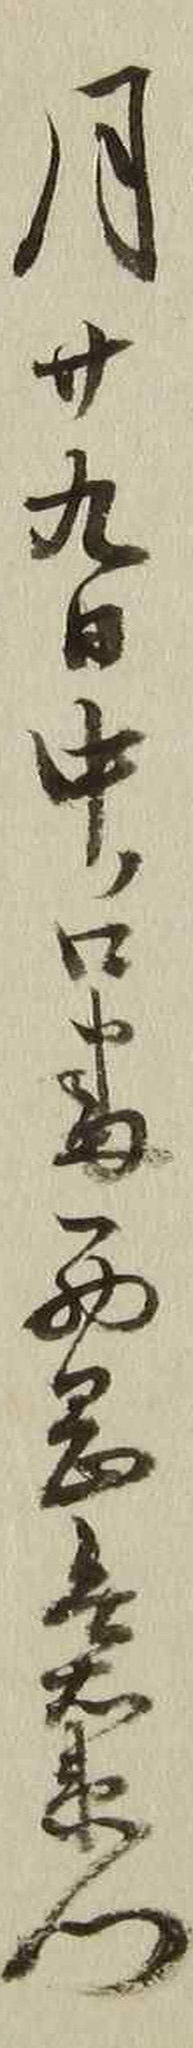月廿九日中ノ口番西岡兵右衛門
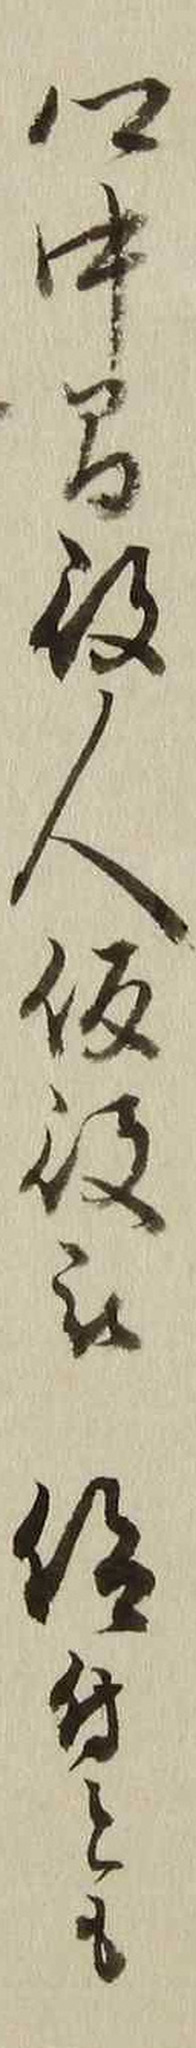郷中間役人仮役被仰付とも
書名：諸士系譜　巻之53　に之部4
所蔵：会津若松市立会津図書館
